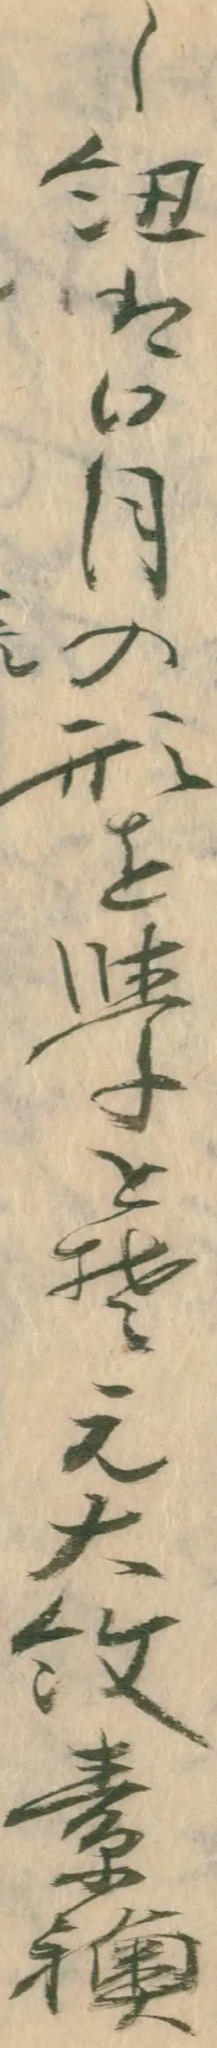し紐は日月の形を学とそ元大紋素襖
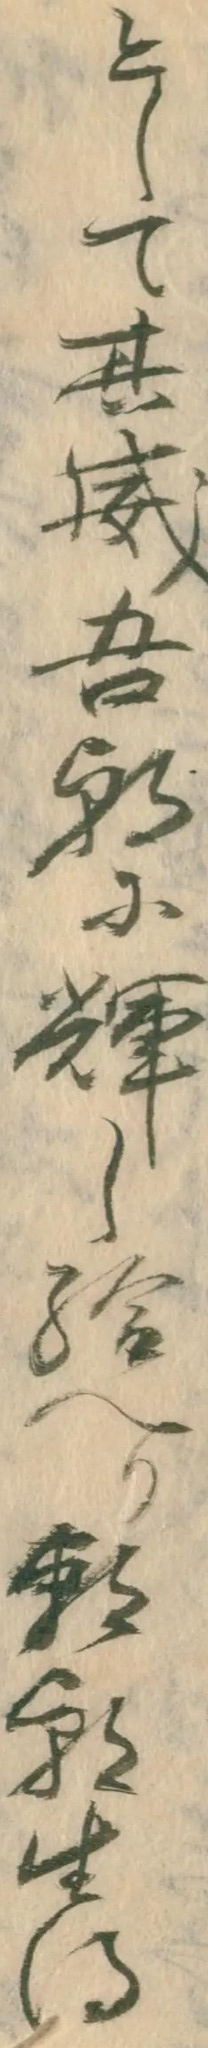として其威吾朝に輝し給へり朝朝生得
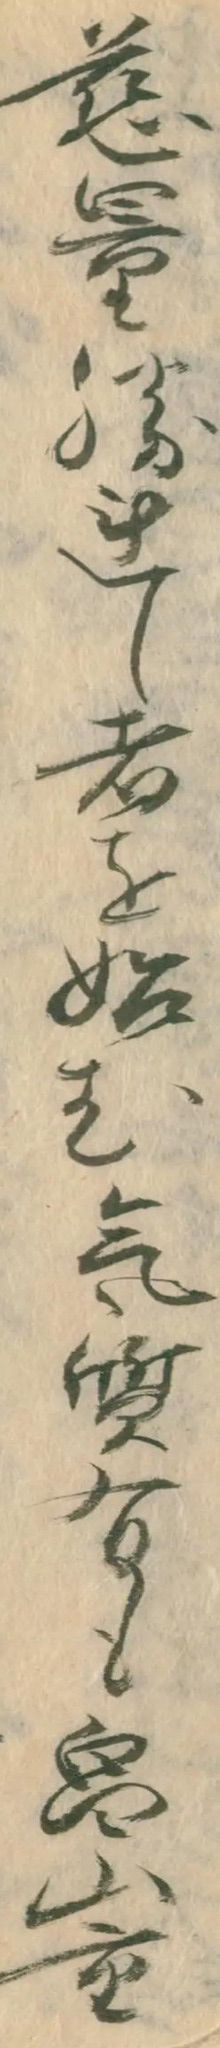慈量勝れし者を始む気質有も畠山重
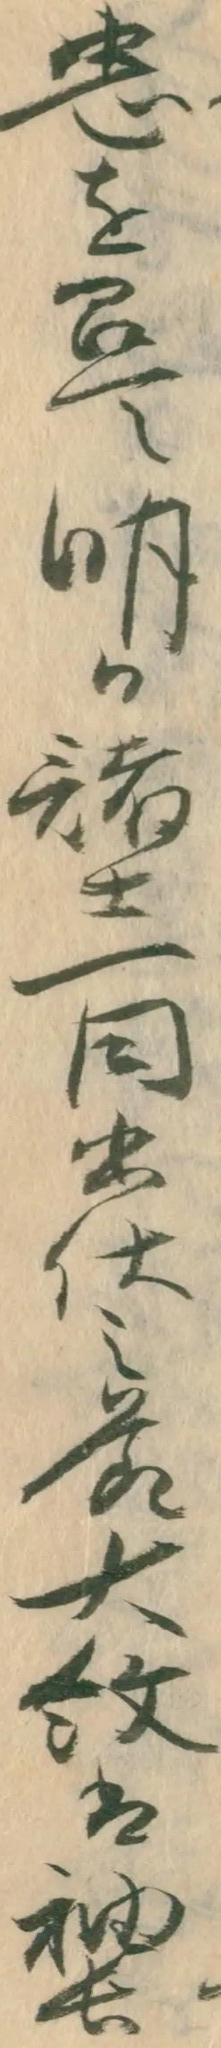忠を召て明日諸士一同出仕之節大紋は袖長

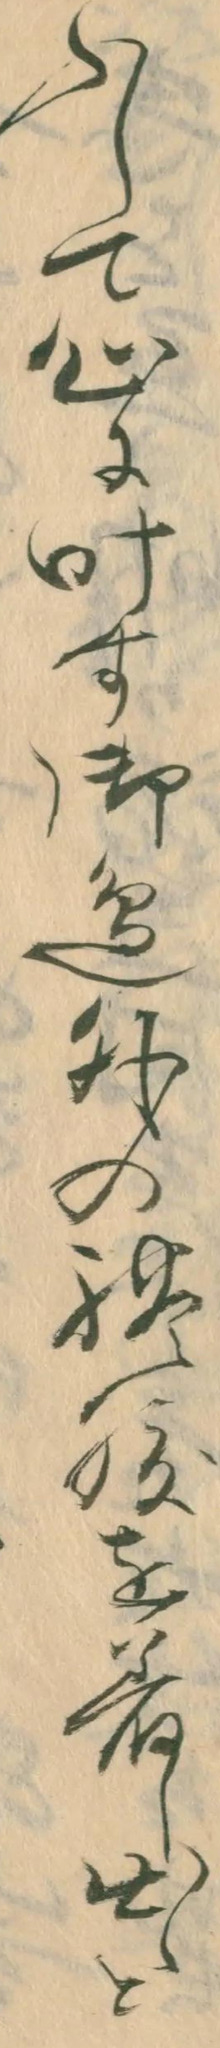ふして心に叶す御辺外の礼腹を着し出候と
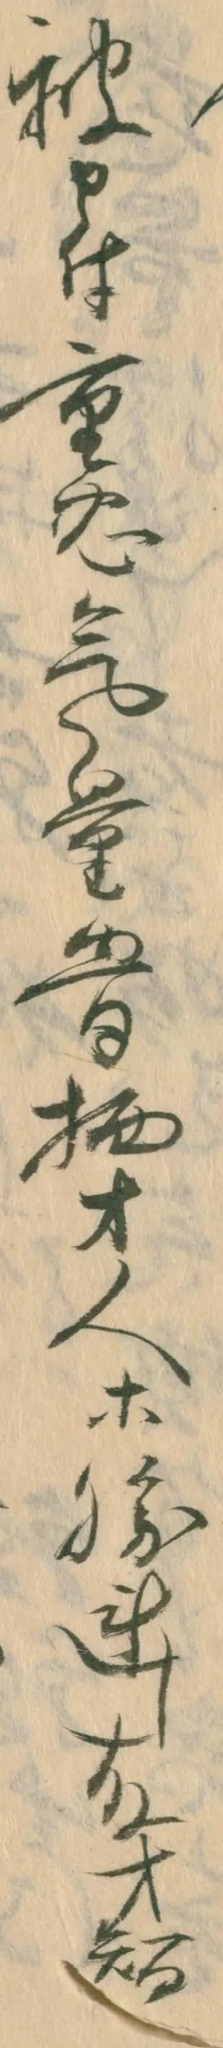被申付重忠気量骨柄才人等勝れし故才智
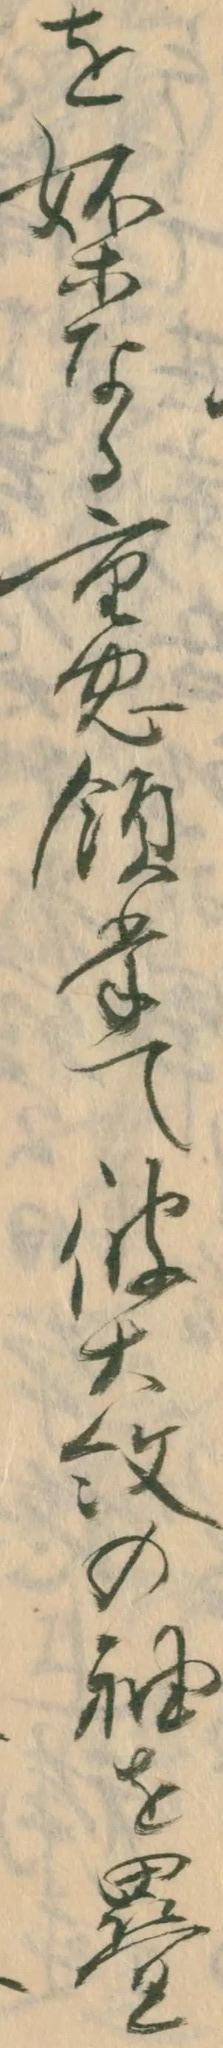を妬等なる重忠領掌て彼大紋の袖を畳
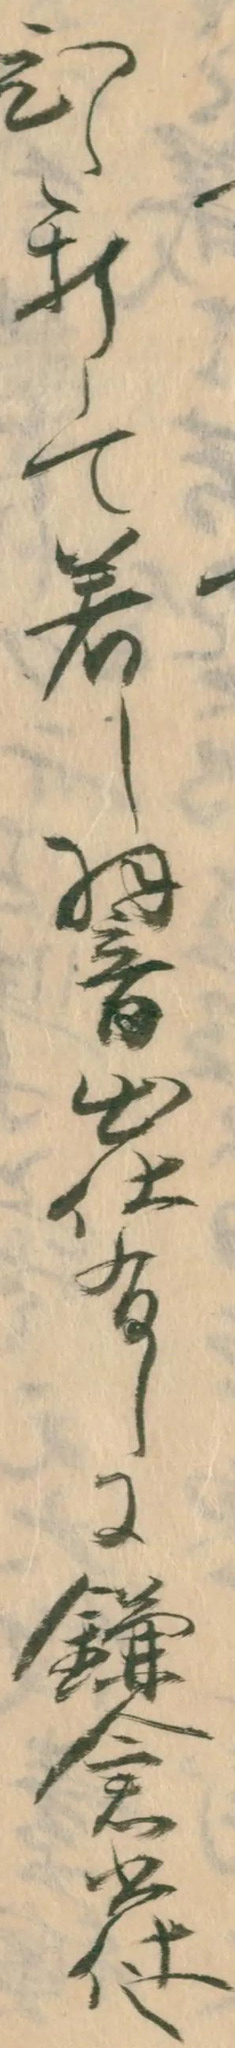ひた打して着し翌日出仕有しに鎌倉出仕之
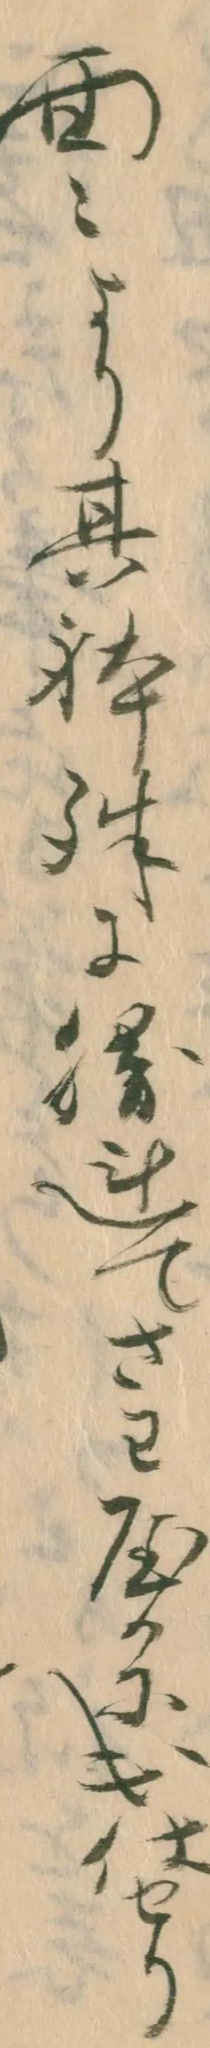面々より其体殊に勝れてさわやかに出仕せり
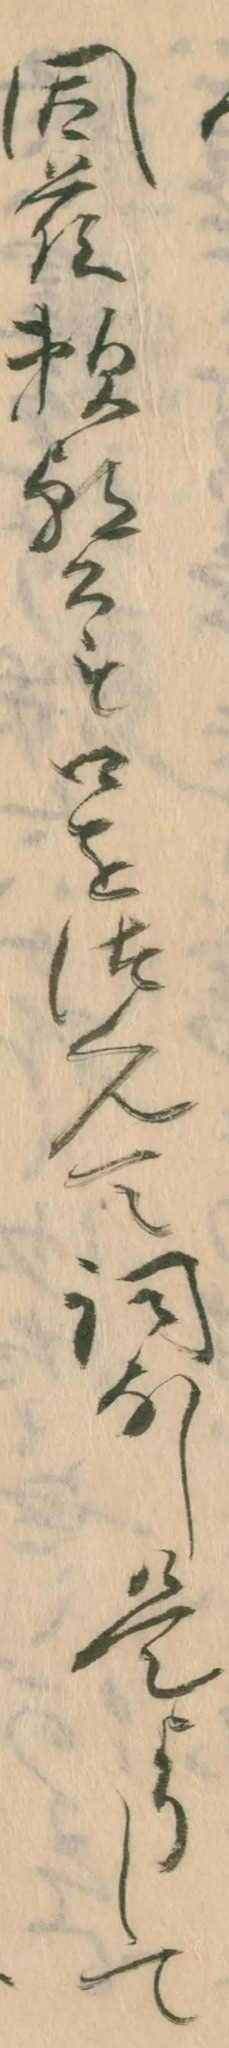因玆頼朝公も口をつくんて詞なし是よりして
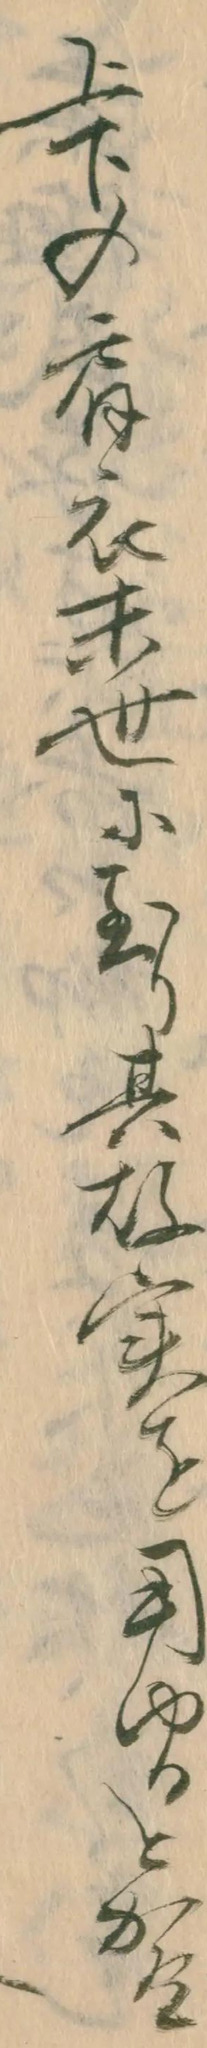上下の肩衣末世に至り其故実を用ゆるとかや
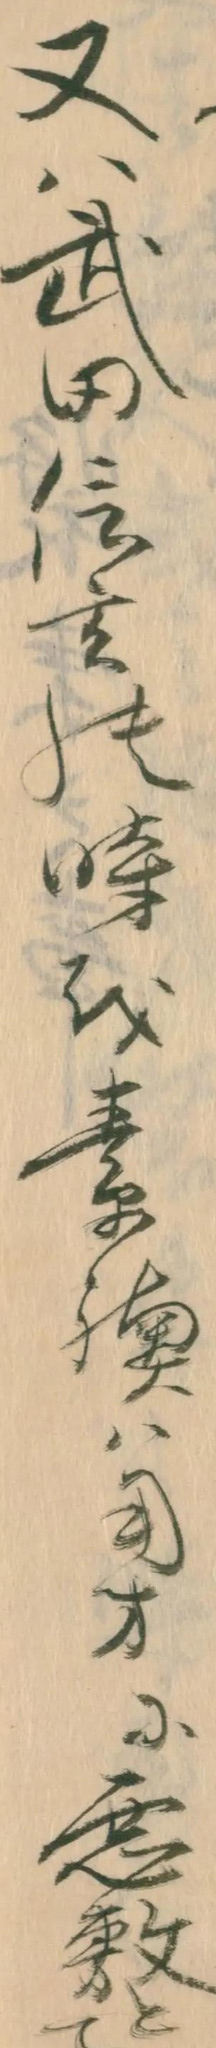又は武田信玄の時を素襖は用方に悪敷とて
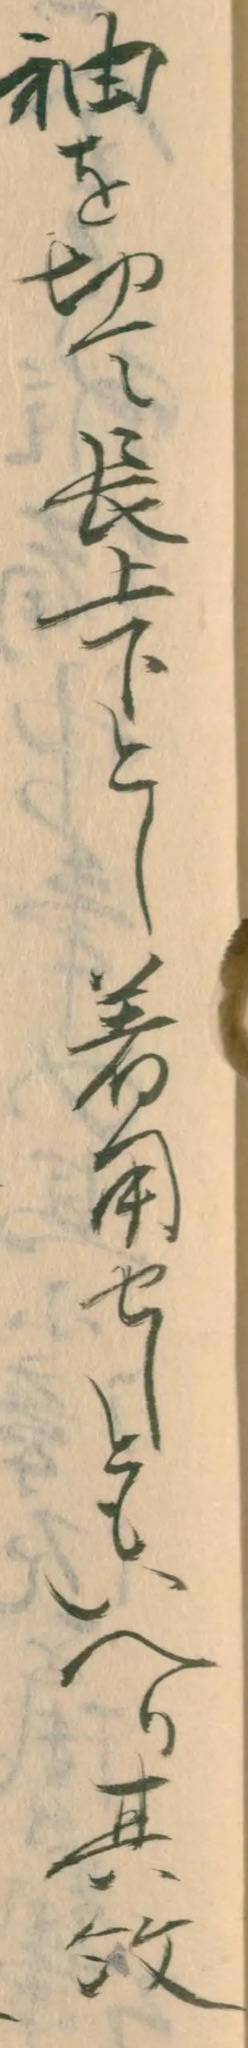袖を切て長上下とし着用せしともいへり其紋
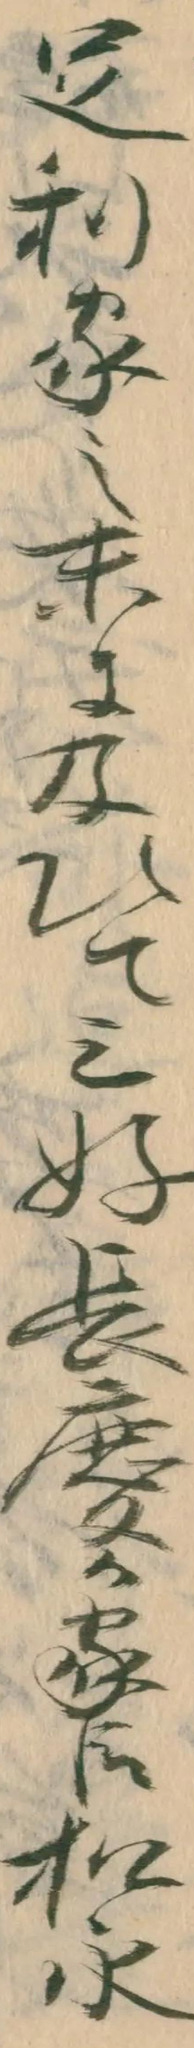足利家之末に及ひて三好長慶か家臣松永
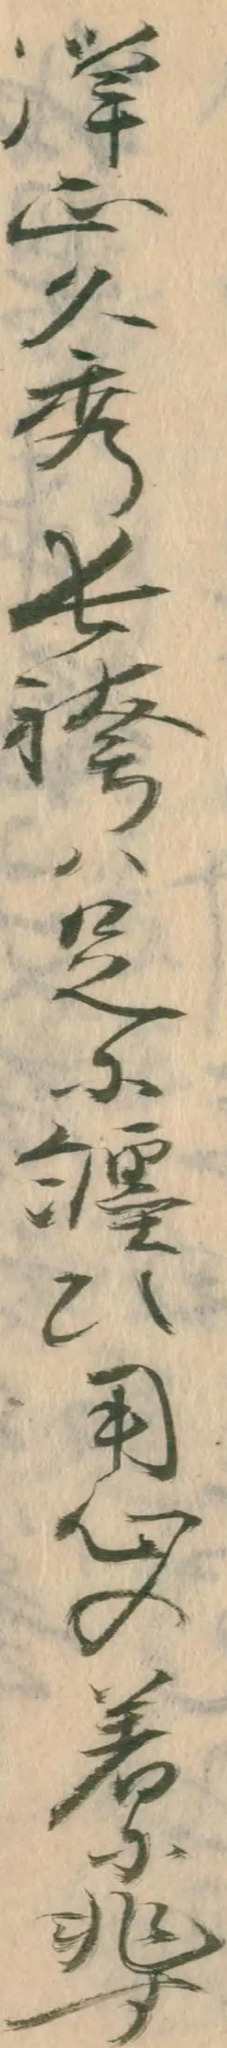弾正久秀長袴は足に纏ひ用心の着に非す
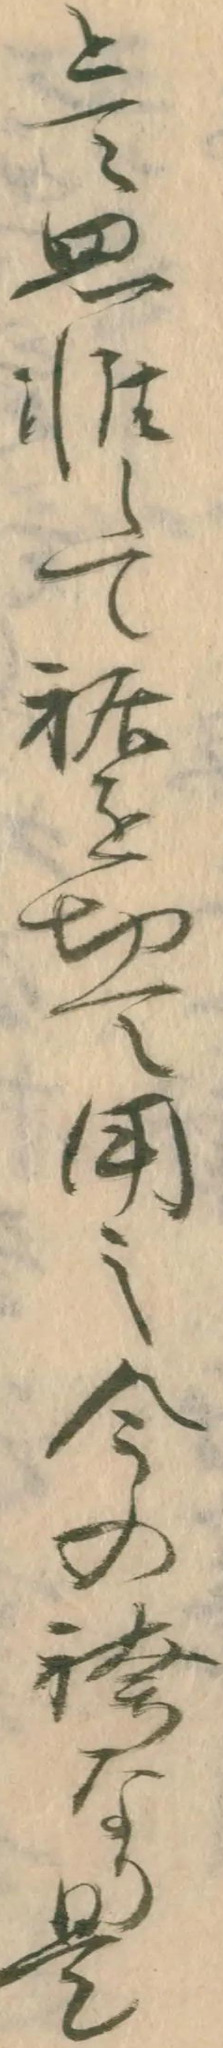とて思惟して裾を切て用之今の袴なり是
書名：賀茂社記録. 第12冊
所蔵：国立国会図書館 National Diet Library, JAPAN
